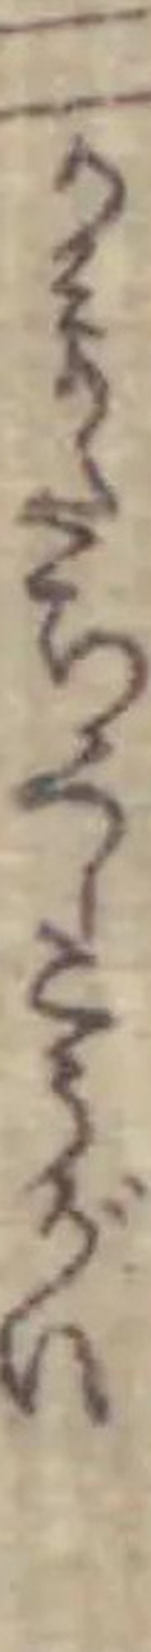かみかたちくしこうがい
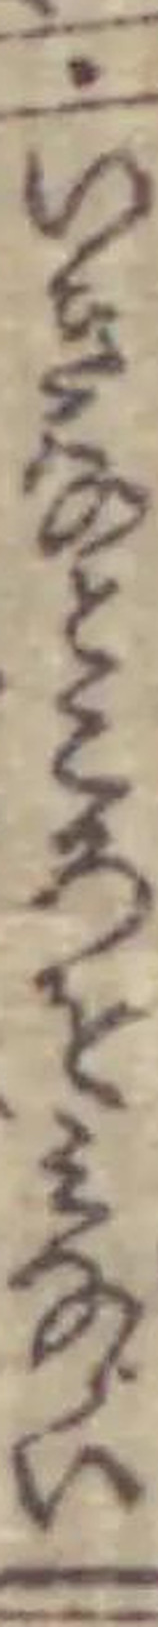いきなところをみならい
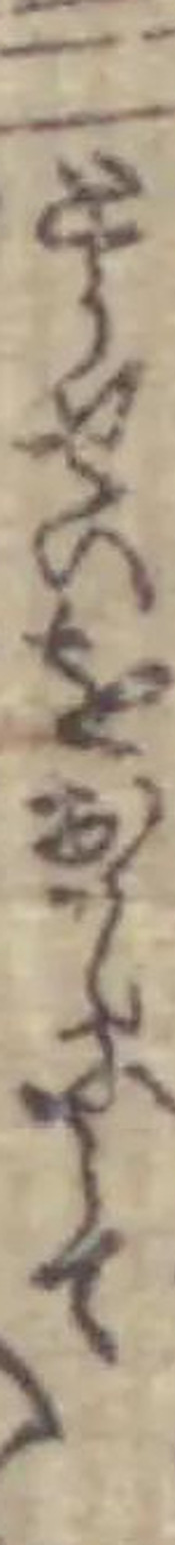とうせいをおもにして
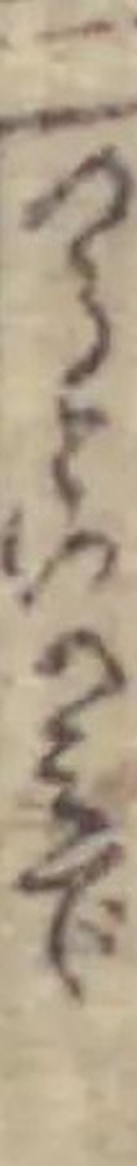つうといふみで
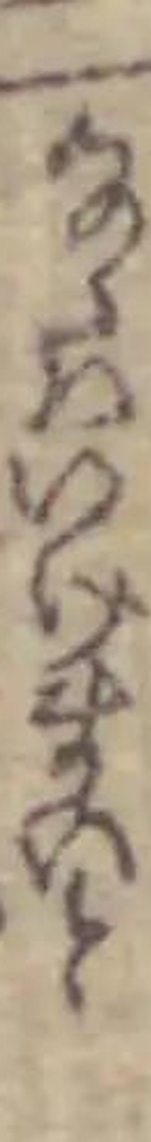なくはいけまいと
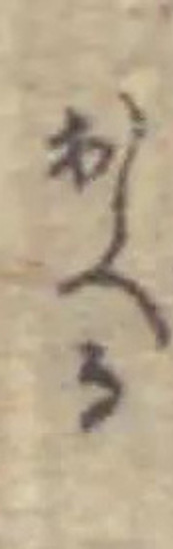おしへる
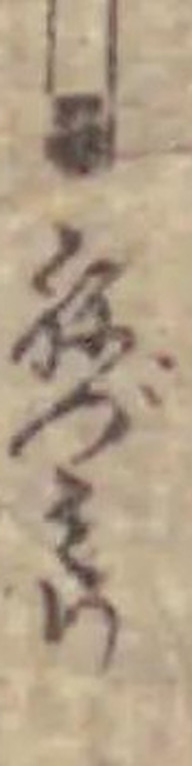ねづみは
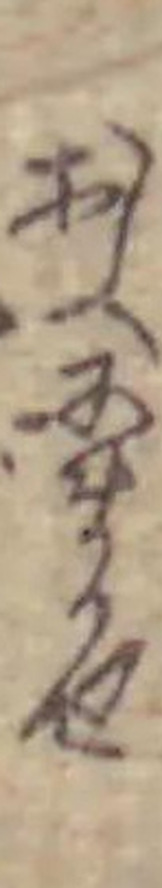おしへにまかせ
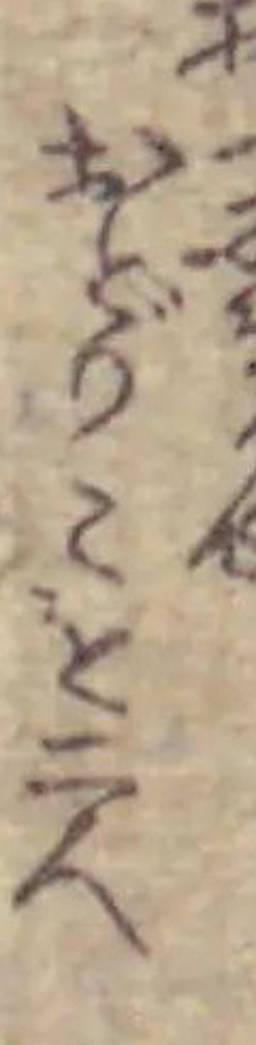おどりこを二人
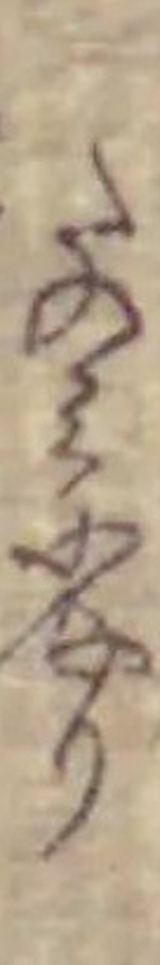たのみにやり
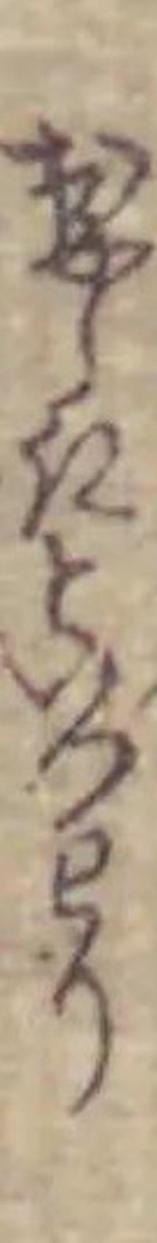おやしきといつわり
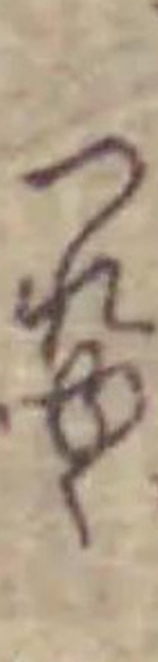つれゆく
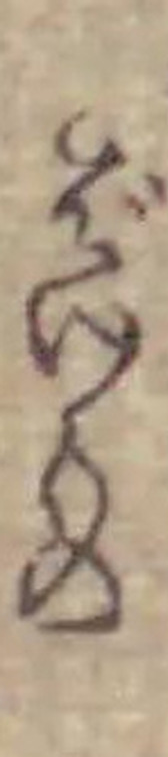ばけもの
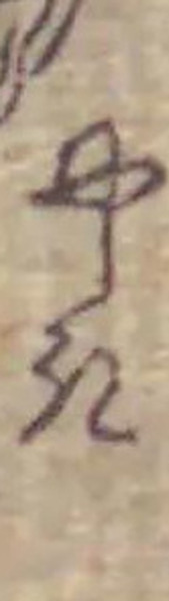やしき
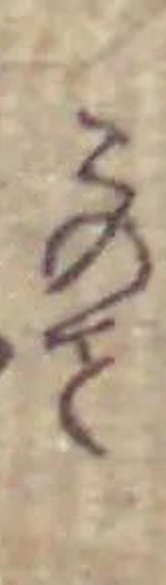このこと

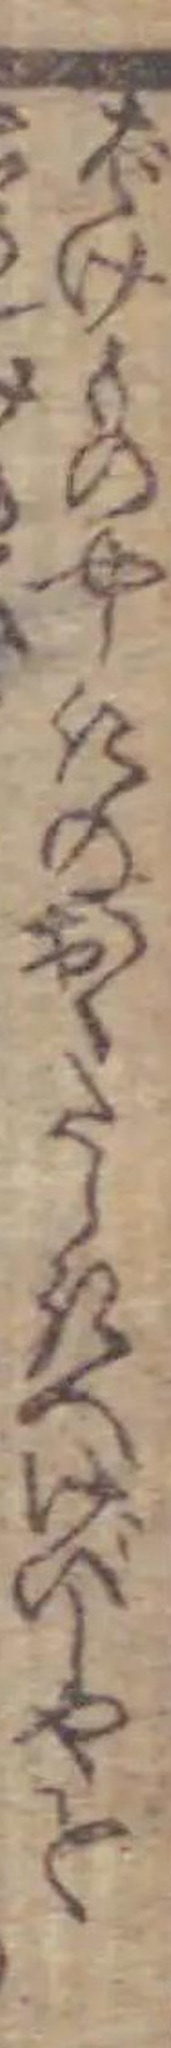ばけものやしきのおくたしきへげいしやを
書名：化物昼寝鼾 2巻
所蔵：国立国会図書館 National Diet Library, JAPAN
